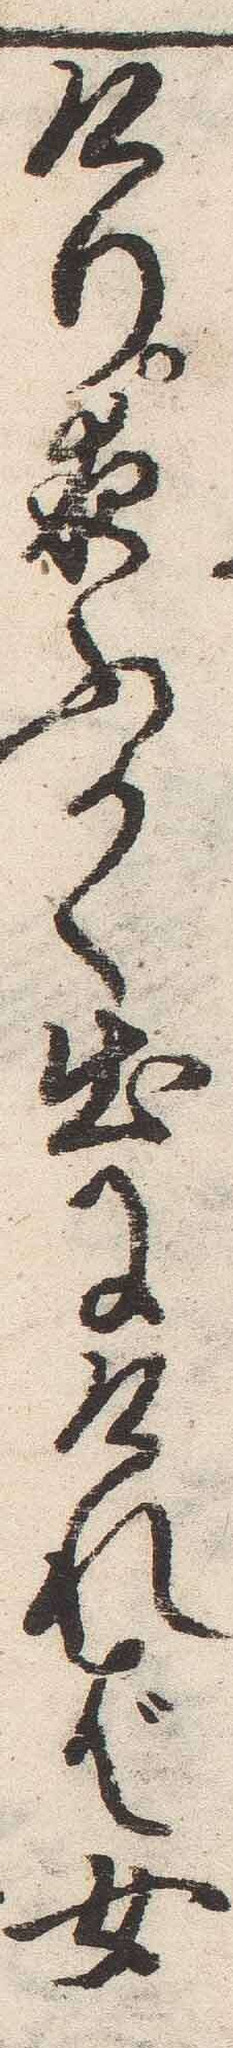けり。夜ふかく出にければ女
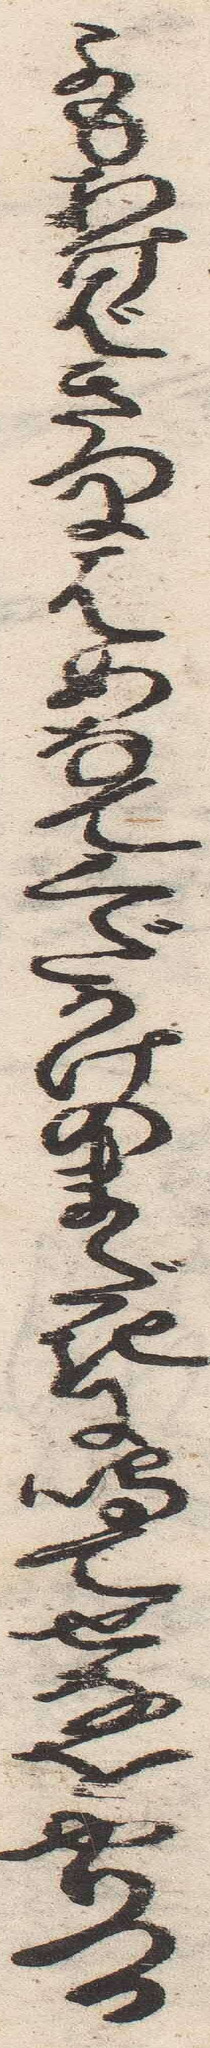よもあけばきつにはめなてくだかけのまだきに鳴てせなをやりつる
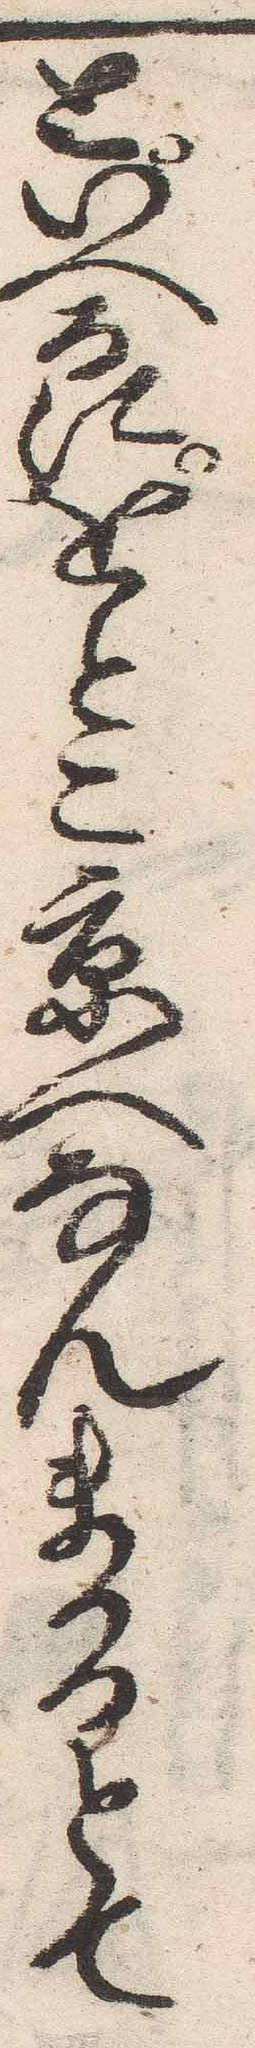と。いへるに。をとこ京へなんまかるとて
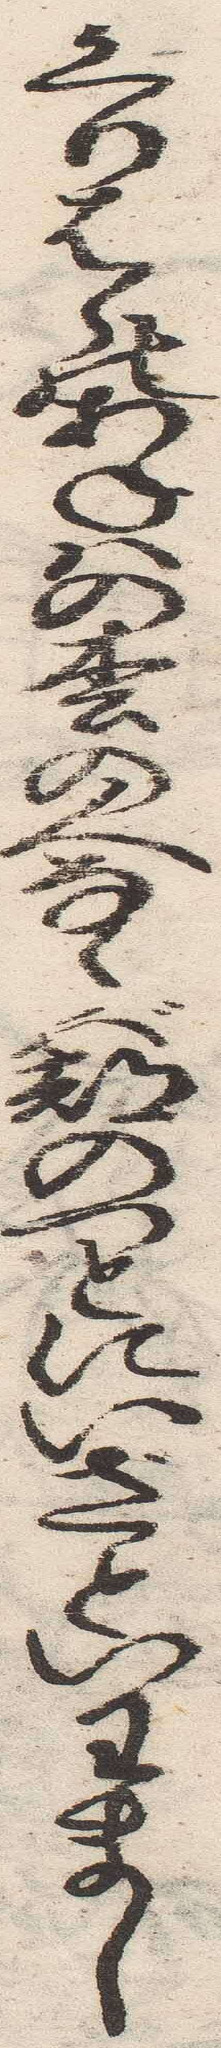くりはらのあねはの松の人ならば都のつとにいざといわまし
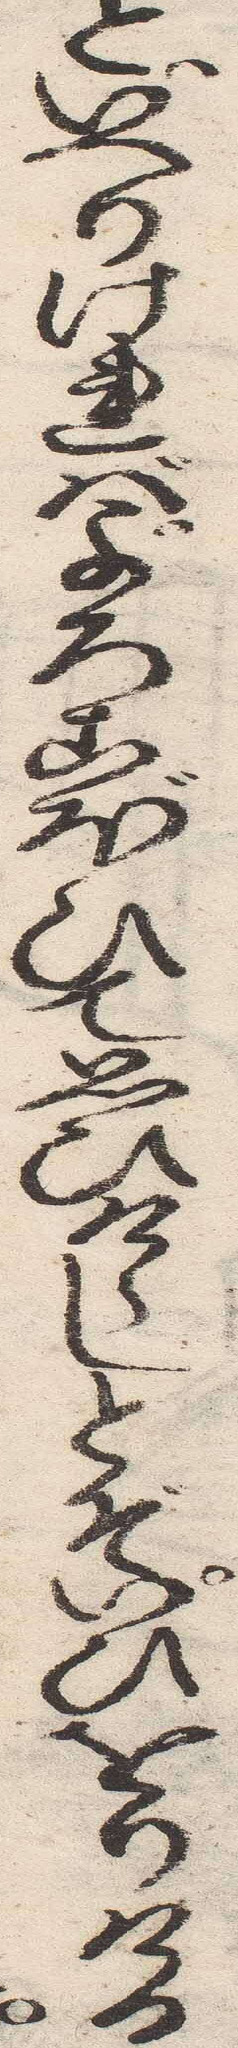と。いへりければ。よろこぼひて思ひけらしとぞ。いひをりける
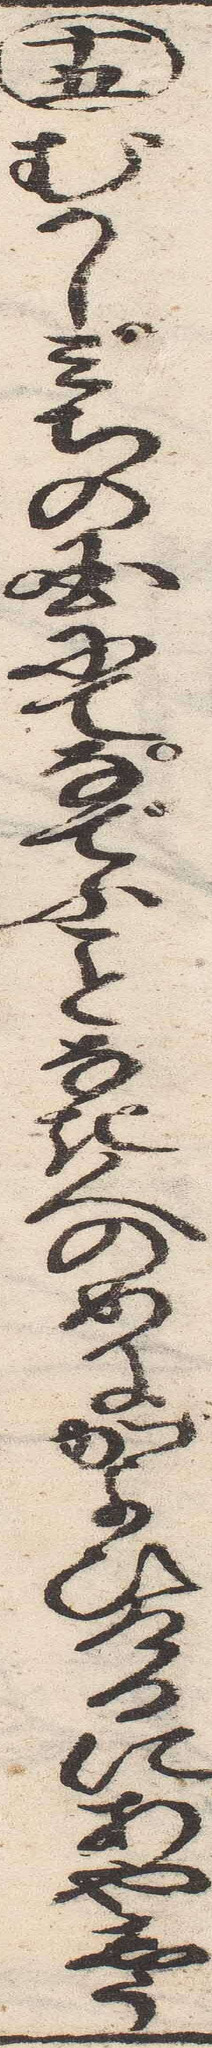十五むかし。みちの国にて。なでふことなき人のめに。かよひけるに。あやしう
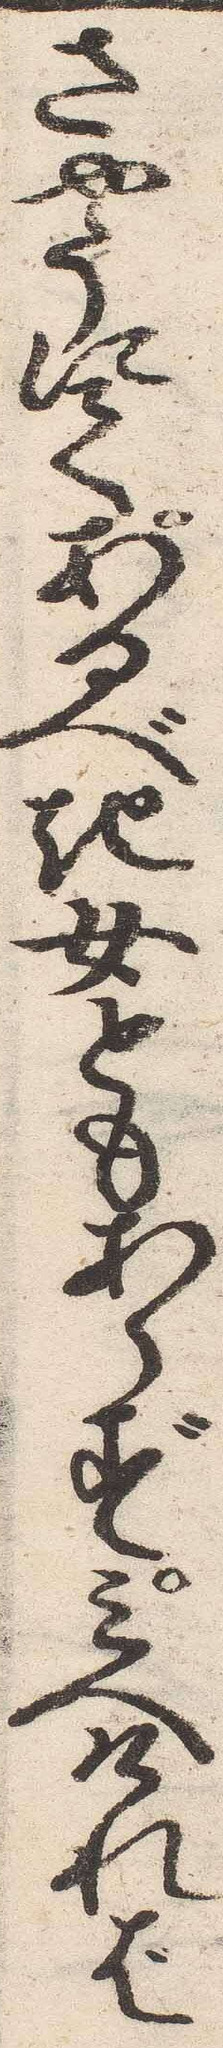さやうにて。あるべき女ともあらず。みへければ
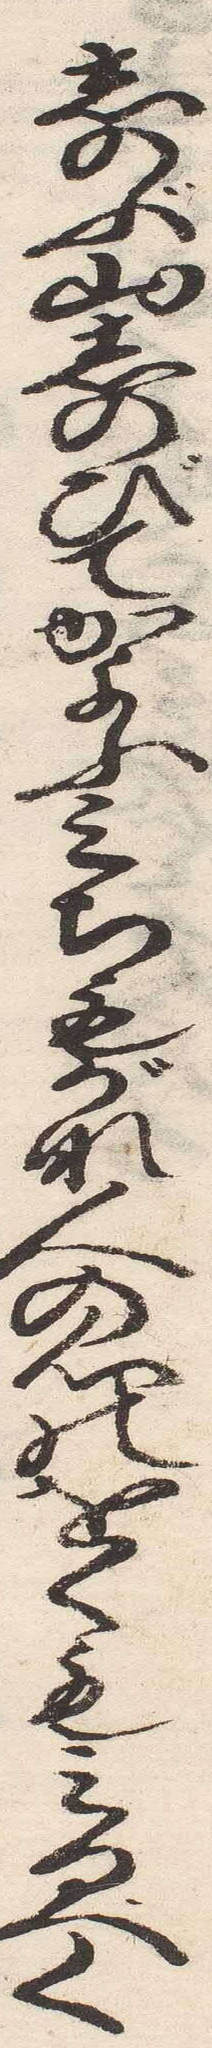しのぶ山しのびてかよふみちもがな人の心のをくもみるべく
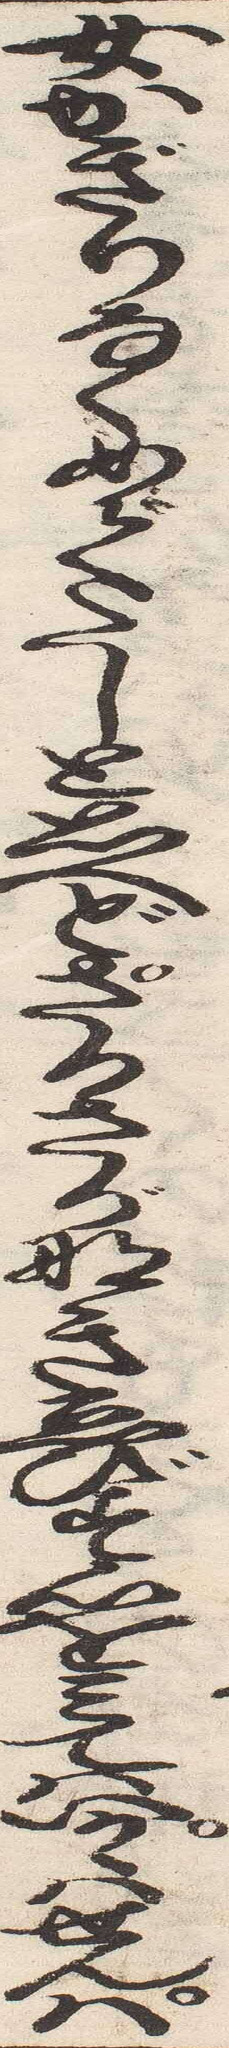女かぎりなくめでたしと思へど。さるさがなきゑびす心をみては。いかゝはせん。は
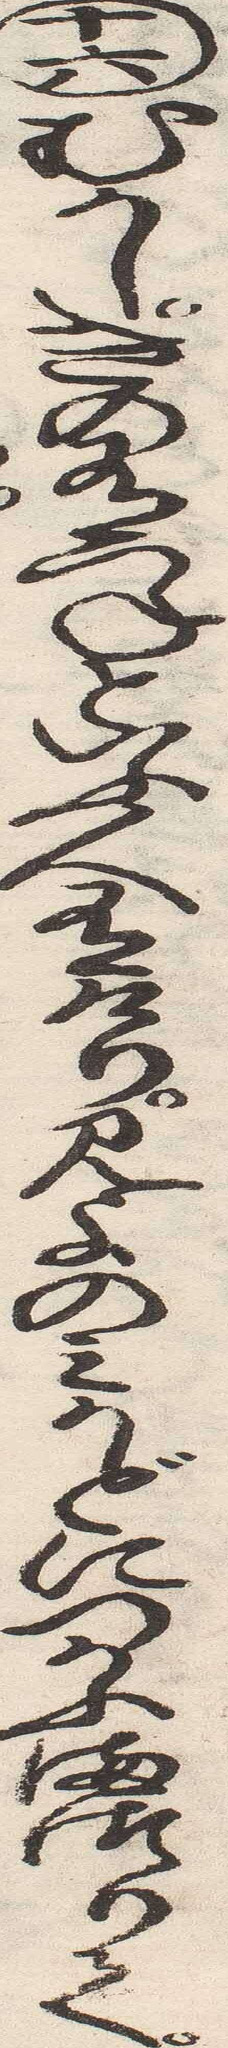十六むかし。きの有つねといふ人有けり。みよのみかどにつかふまつりて。
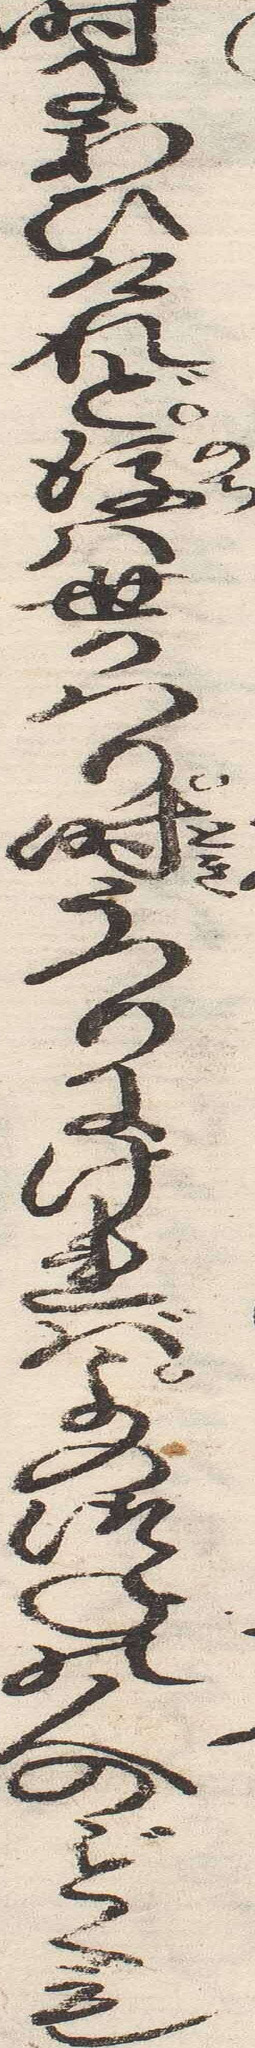時にあひけれど。後は世かはり。時うつりにければ。よのつねの人のごとくも
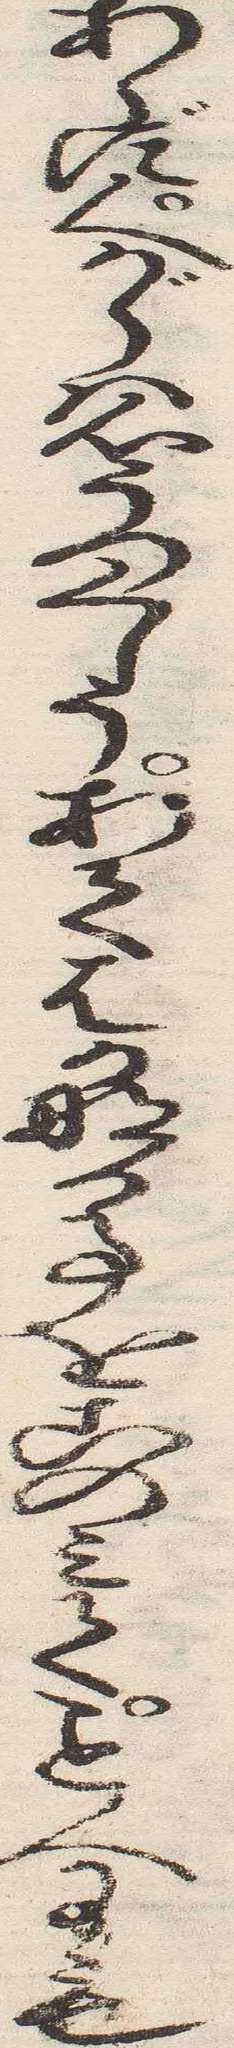あらず。人がらは心うつくしう。あてはかなる事をこのみて。こと人にも
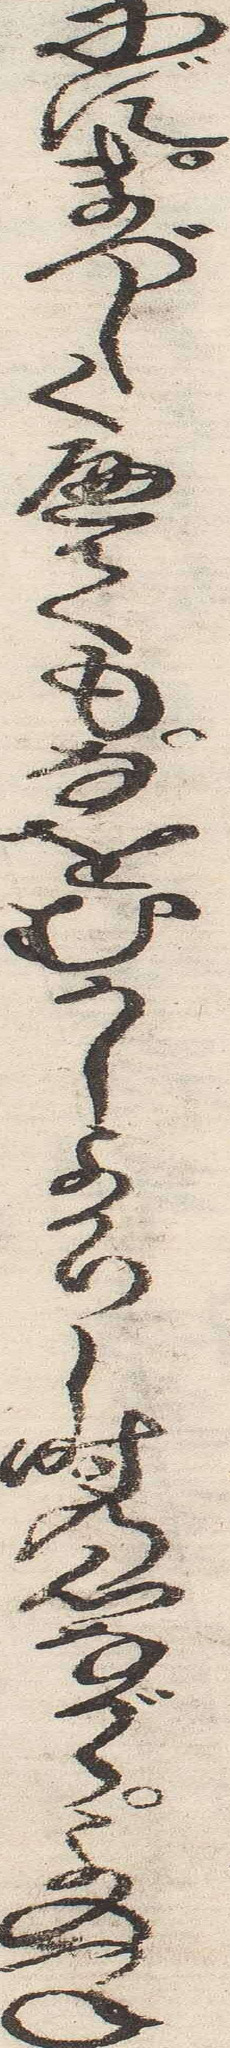にず。まづしくへても。なをむかしよかりし時の心ながら。よのつね
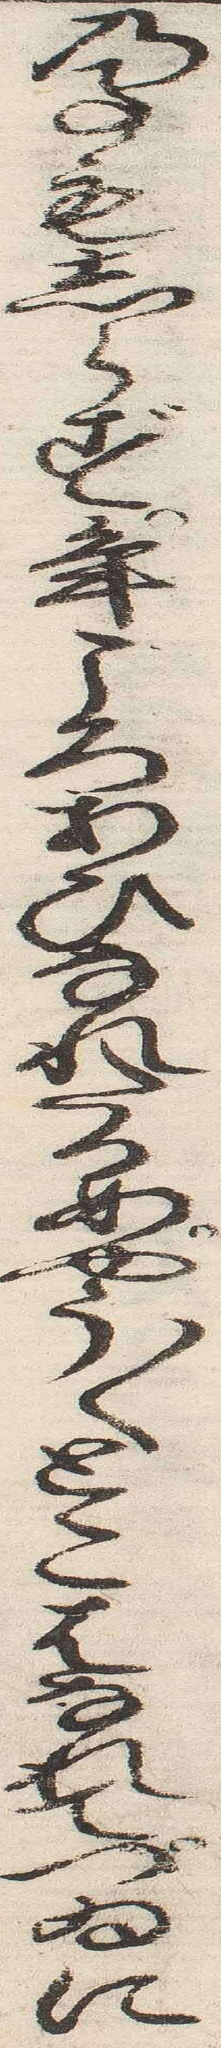の事もしらず。年ころあひなれたるめ。やう〳〵とこはなれて。つゐに
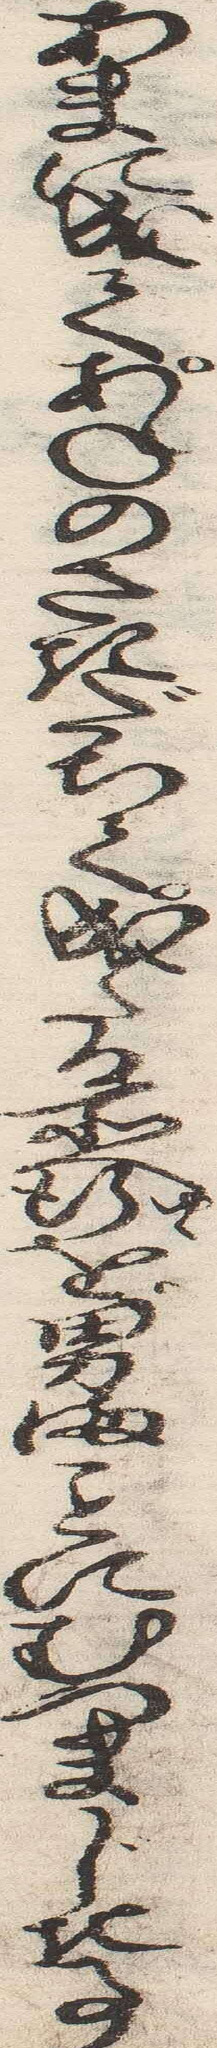あまに成て。あねのさきだちて。成たる所へ行を。男まことにむつまじき事
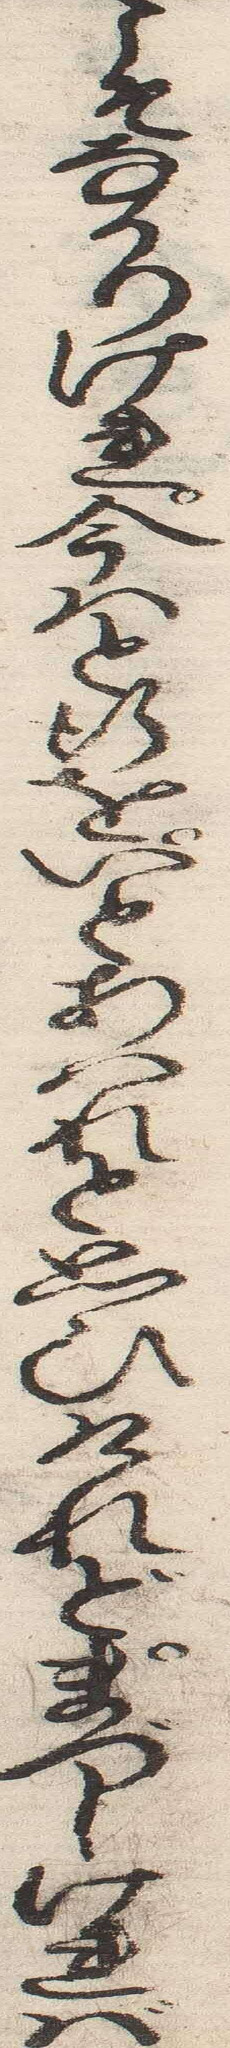こそなかりけれ。今はと行を。いとあはれと思ひけれど。まづしければ
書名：伊勢物語
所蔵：東京学芸大学附属図書館 国文学研究資料館
